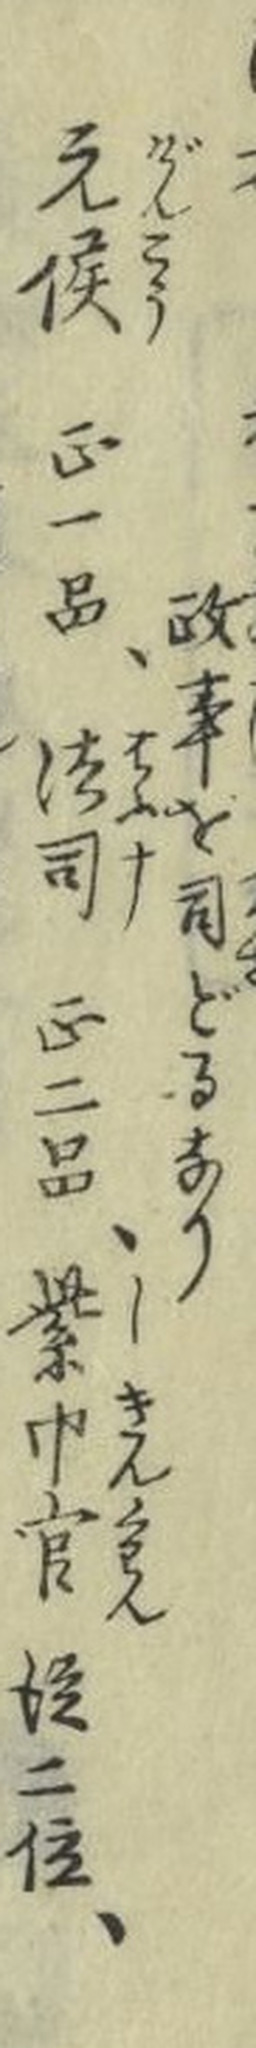元侯正一品、法司正二品、紫巾官従二位、
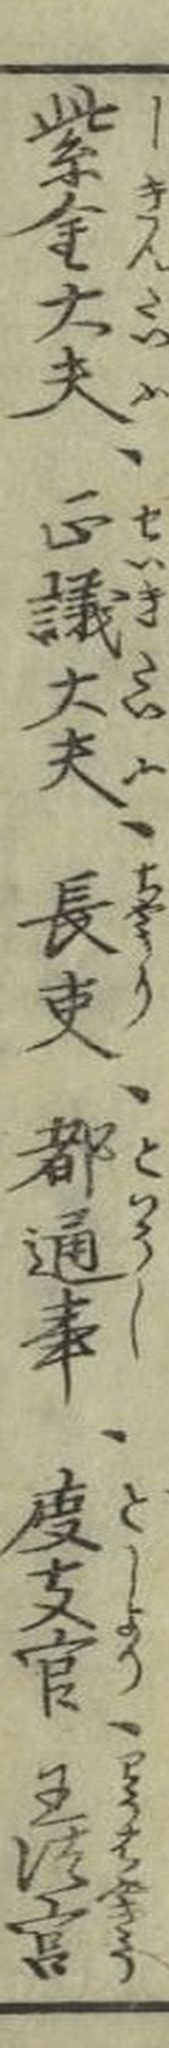紫金大夫、正議大夫、長吏、都通奉、度支官、王法宮

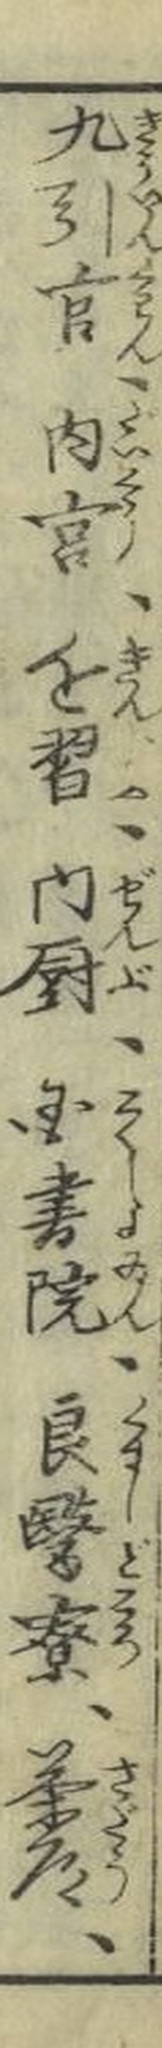九引官、内官、近習、内厨、国書院、良医寮、茶道、
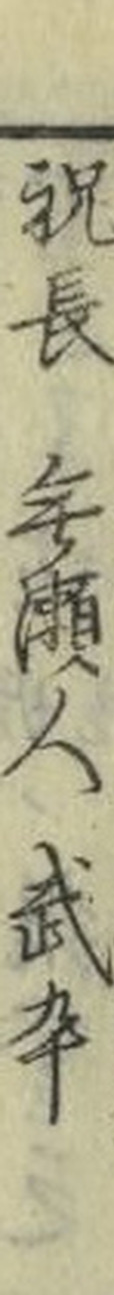祝長、無瀬人、武卒、
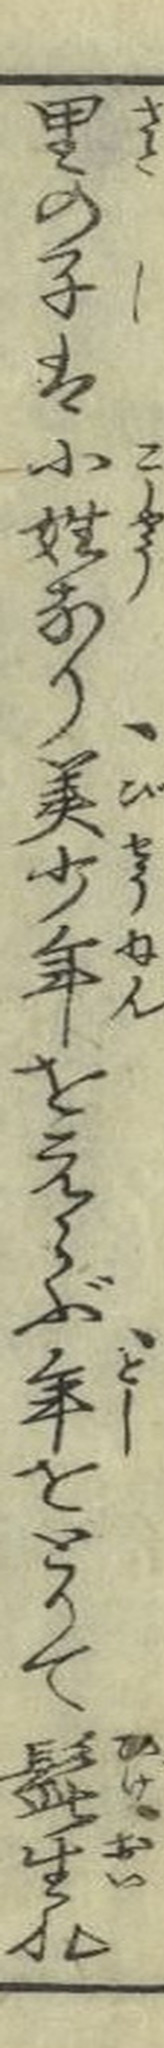里の子は小姓なり、美少年をえらぶ、年をとりて髭生れ
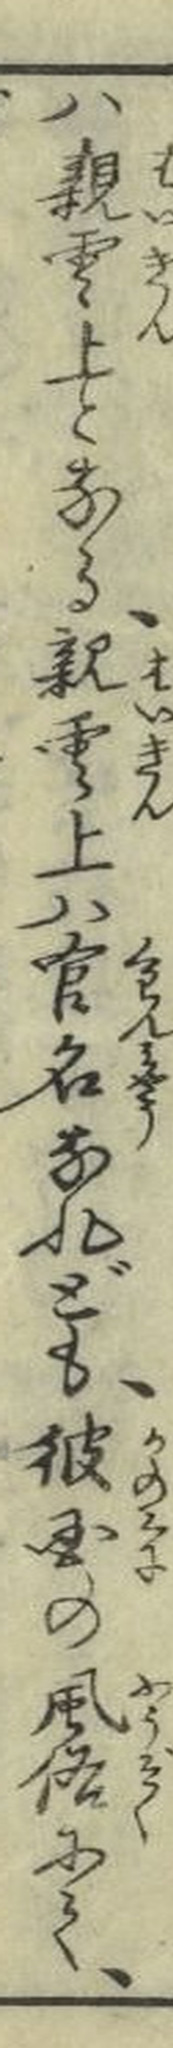は親雲上となる、親雲上は官名なれども、彼国の風俗にて、
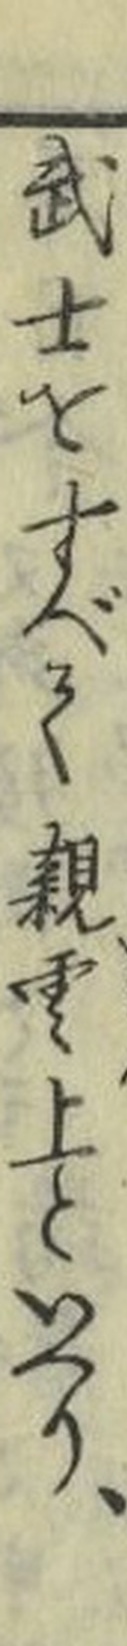武士をすべて親雲上といへり、
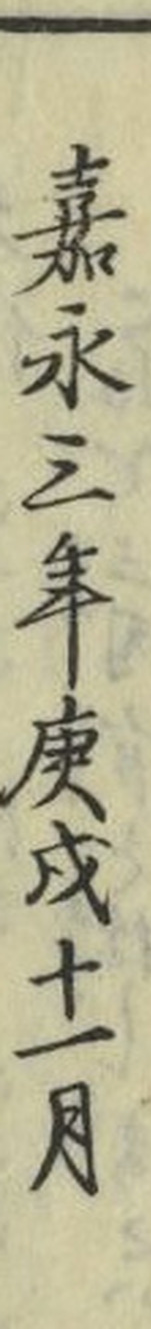嘉永三年庚戌十一月
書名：琉球入貢紀略
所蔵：University of the Ryukyus Library
